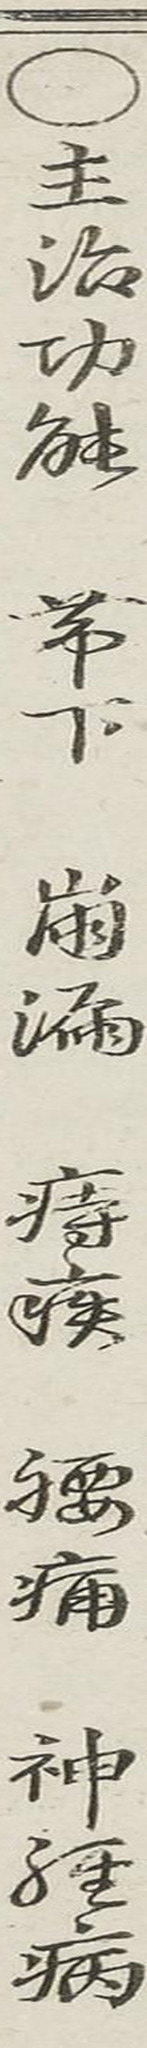○主治功能帯下崩漏痔疾腰痛神経病
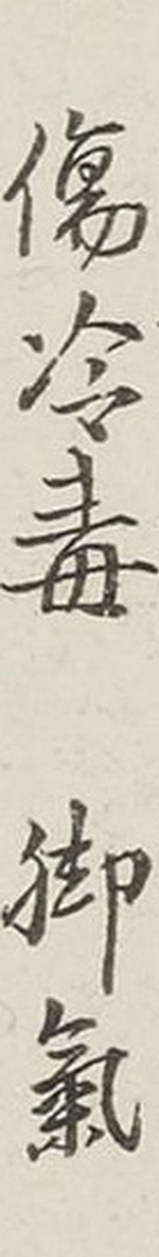傷冷毒脚氣
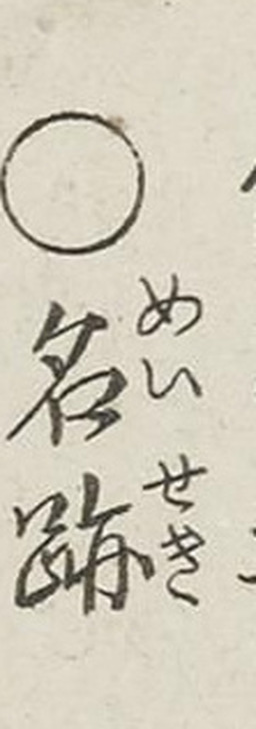○名跡
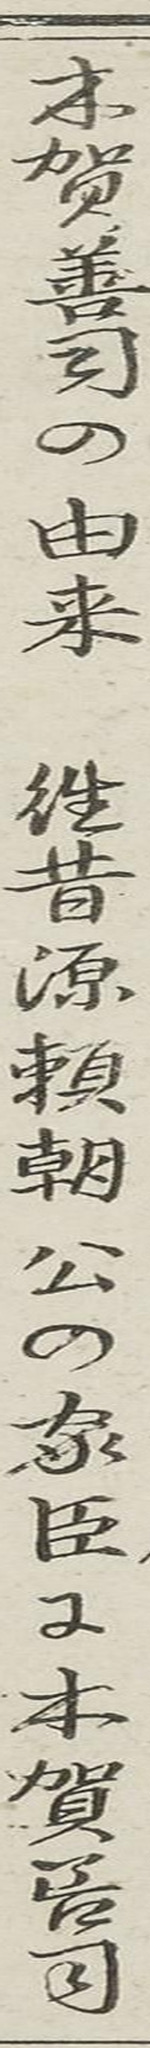木賀善司の由来往昔源頼朝公の家臣に木賀善司
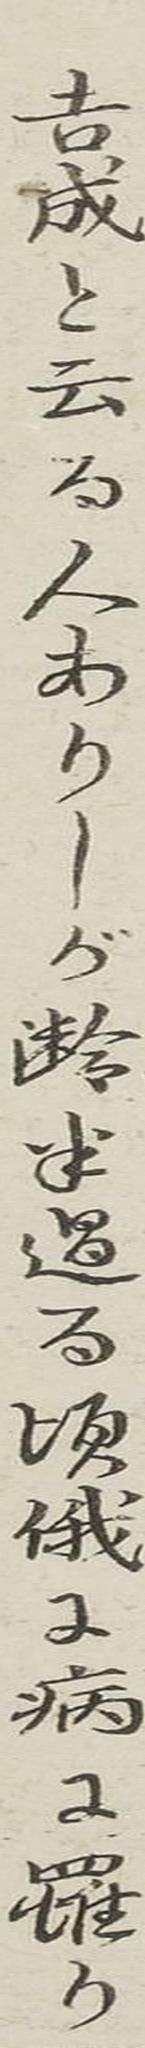吉成と云る人ありしが齢半過る頃俄に病に罹り

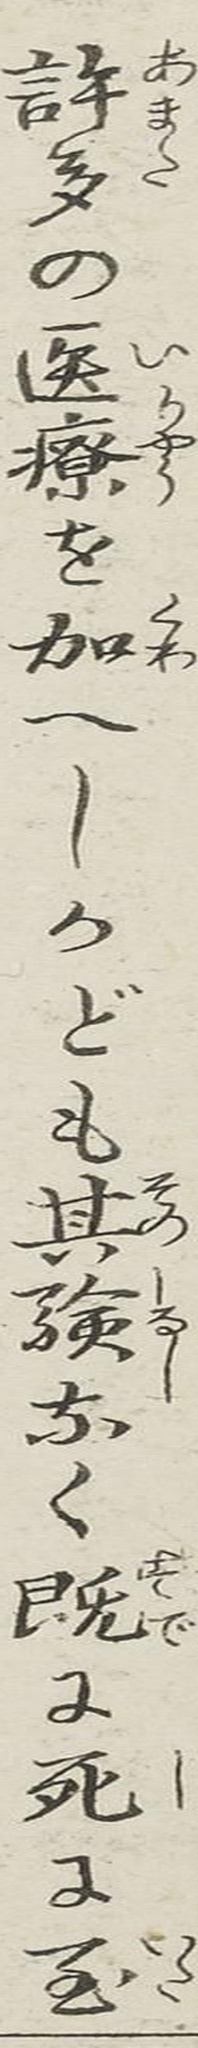許多の医療を加へしかども其験なく既に死に至
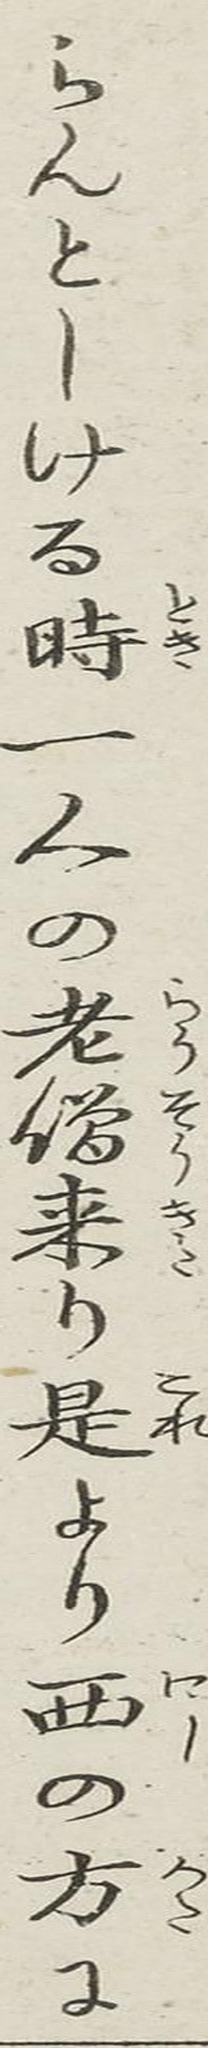らんとしける時一人の老僧来り是より西の方に
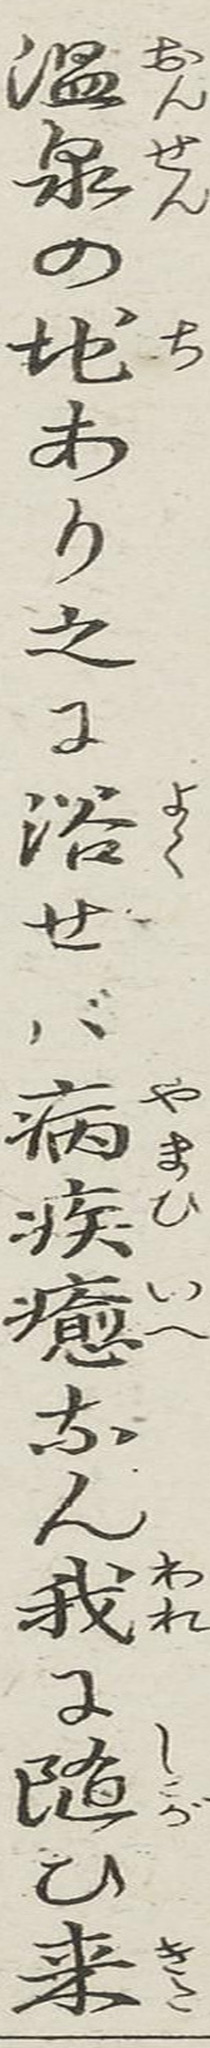温泉の地あり之に浴せば病疾癒なん我に随ひ来
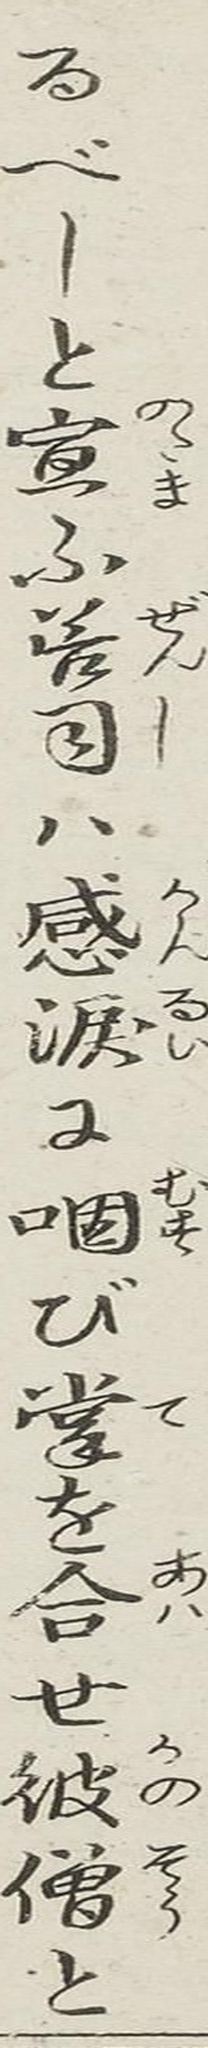るべしと宣ふ善司は感涙に咽び掌を合せ彼僧と
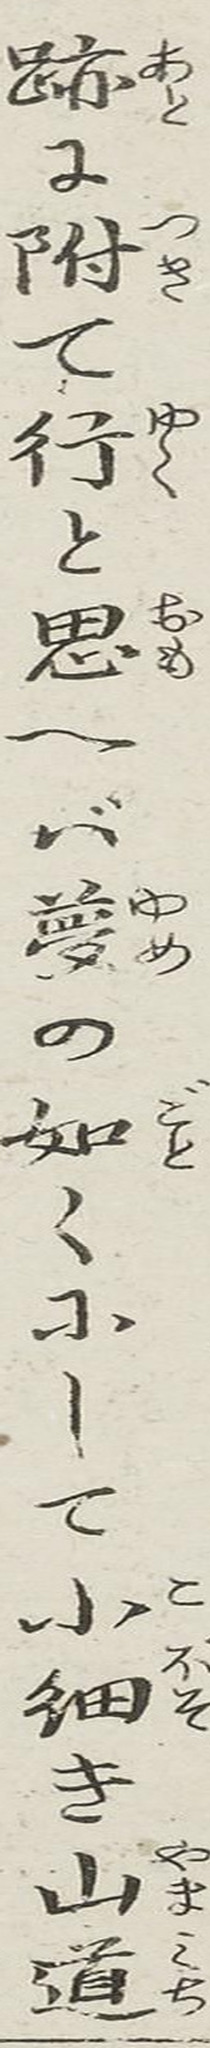跡に附て行と思へば夢の如くにして小細き山道
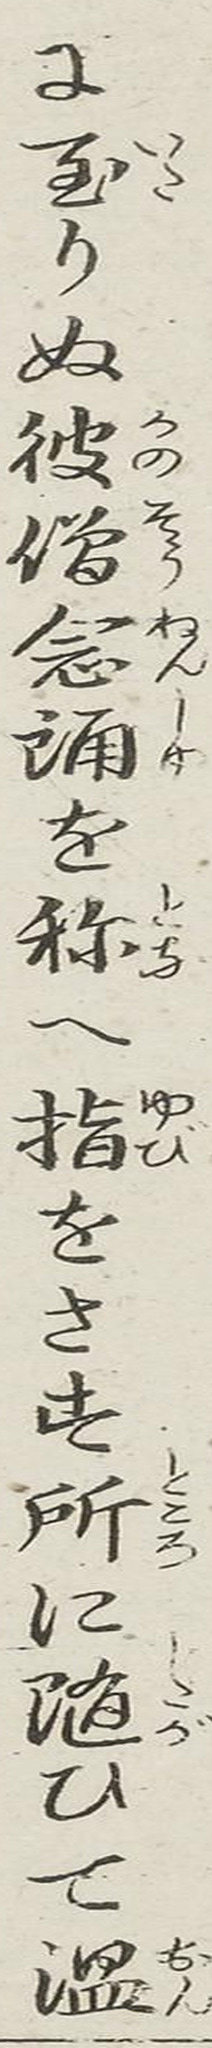に至りぬ彼僧念誦を称へ指をさす所に随ひて温
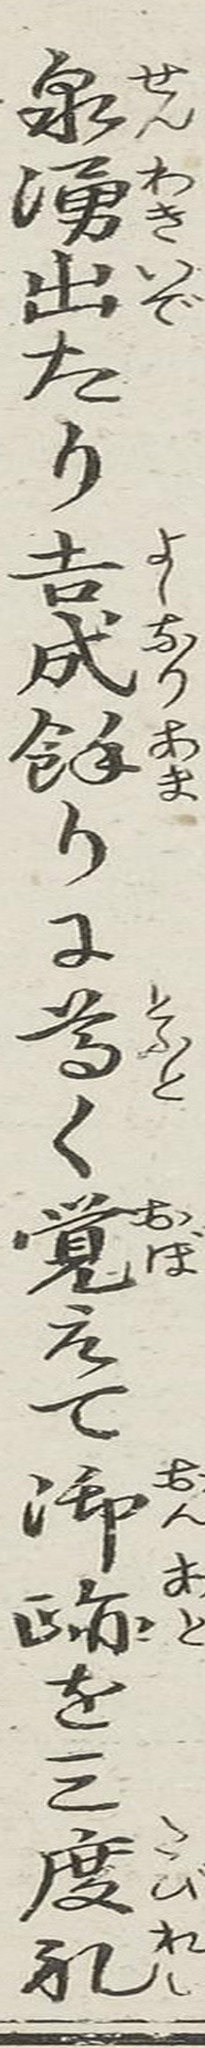泉湧出たり吉成餘りに尊く覚えて御跡を三度礼
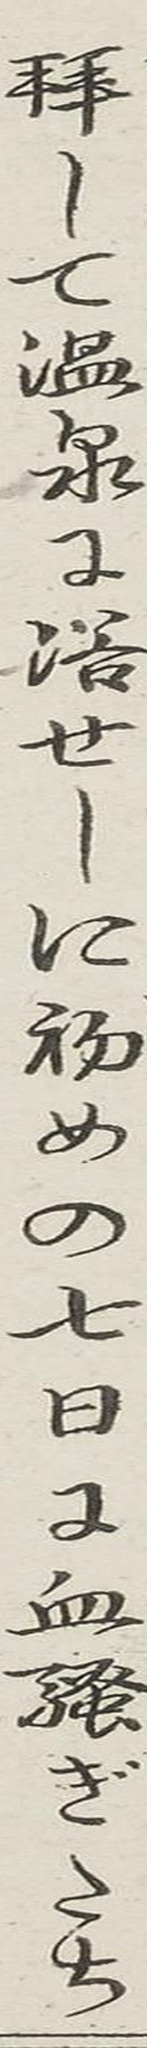拝して温泉に浴せしに初めの七日に血騒ぎたち
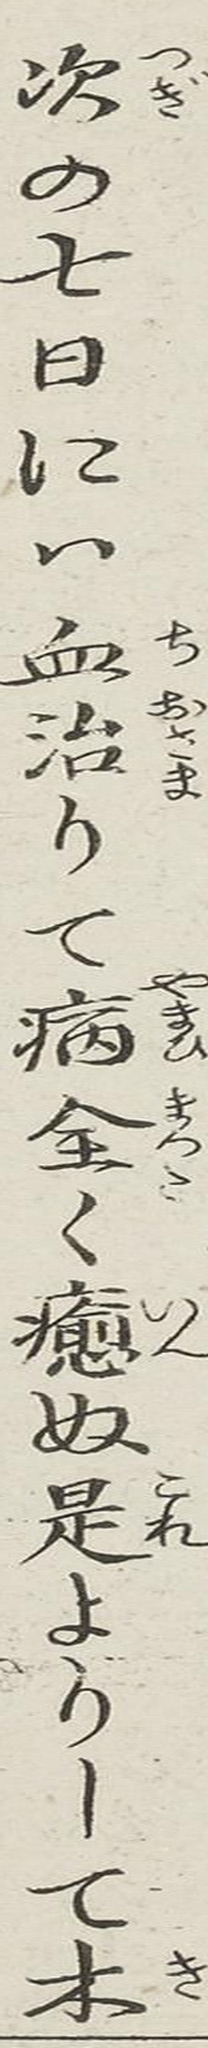次の七日には血治りて病全く癒ぬ是よりして木
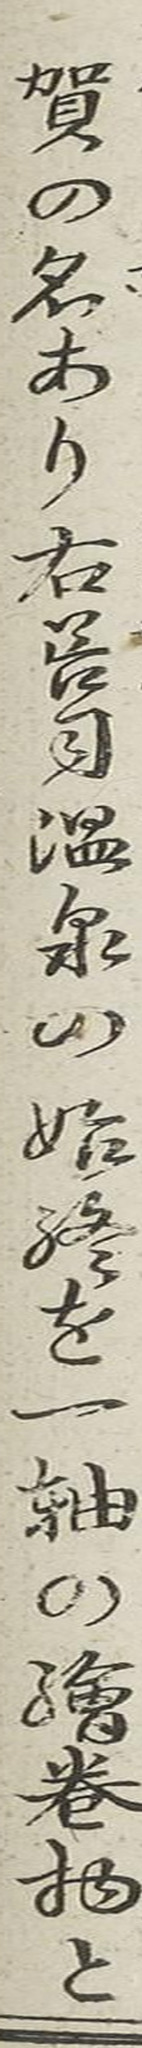賀の名あり右善司温泉の始終を一軸の繪巻物と
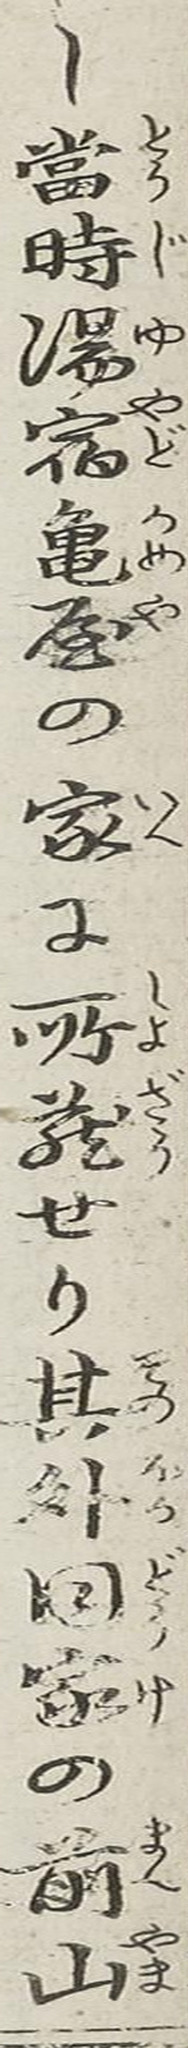し当時湯宿亀屋の家に所蔵せり其外同家の前山
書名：箱根温泉誌　全
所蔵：東京大学地震研究所図書室 Earthquake Research Institute Library, The University of Tokyo, JAPAN
